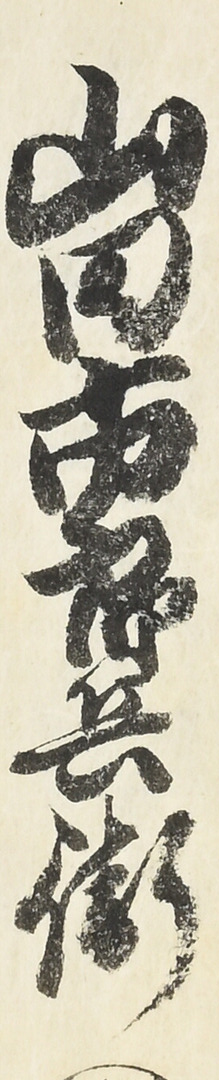山田市郎兵衛㊞
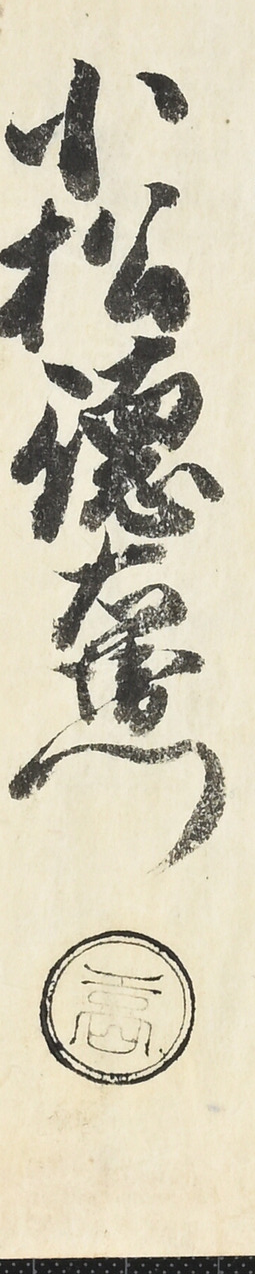小松徳右衛門㊞
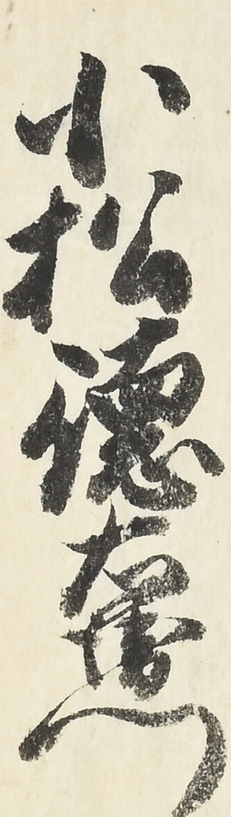小松徳右衛門㊞

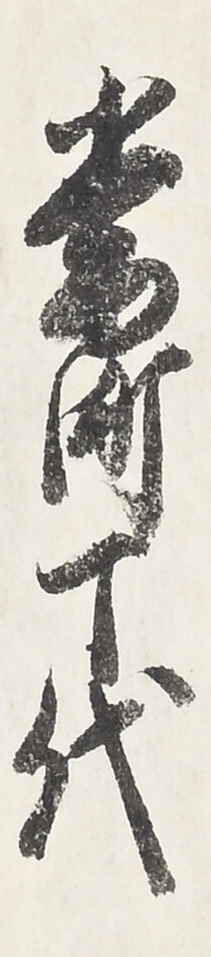当町丁代
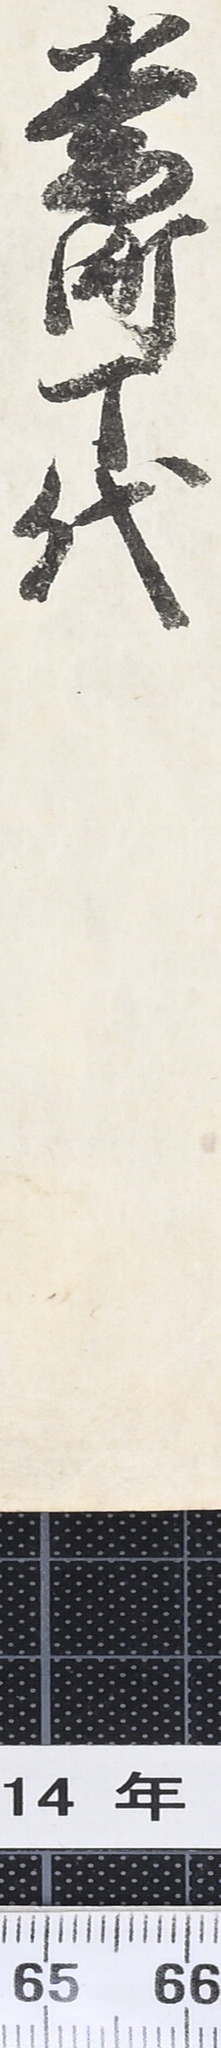当町丁代
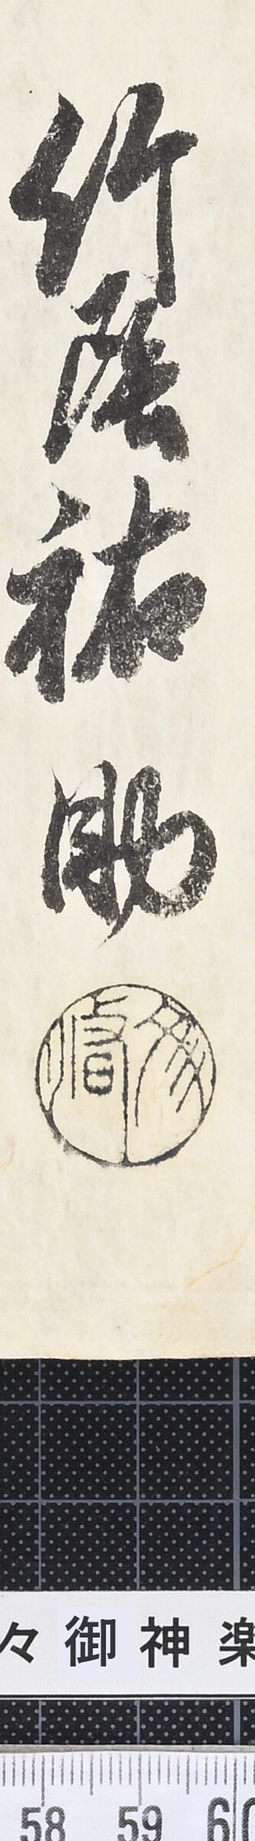竹屋祐助㊞
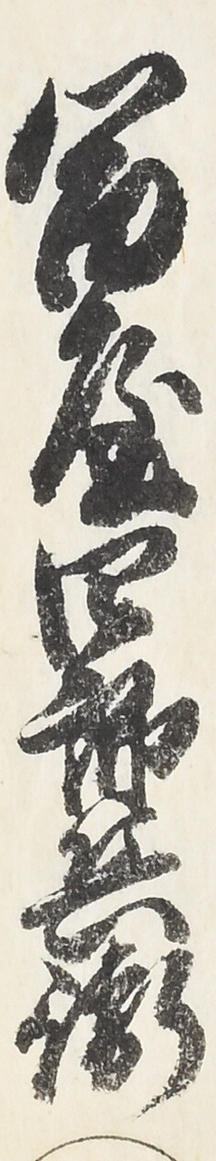冨屋四郎兵衛㊞
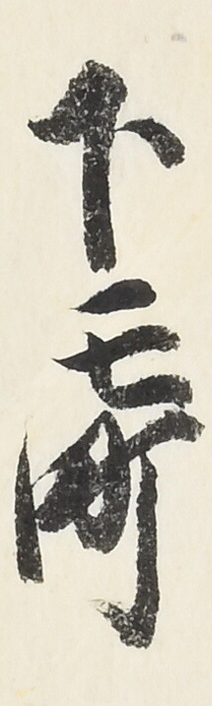下モ町
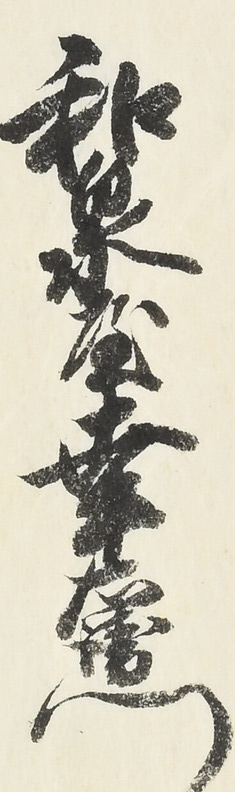和泉屋幸右衛門㊞
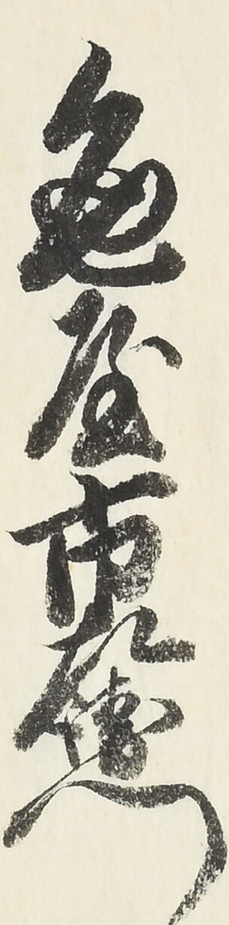色屋市左衛門㊞
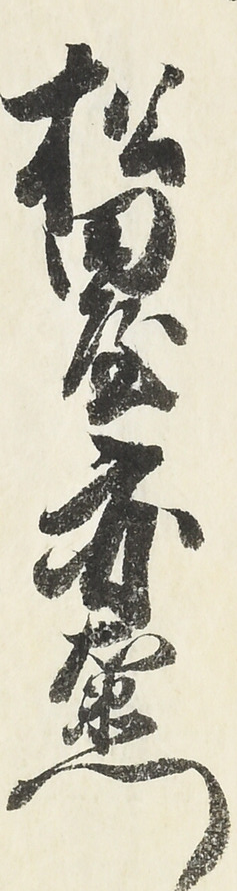松田屋亦右衛門㊞
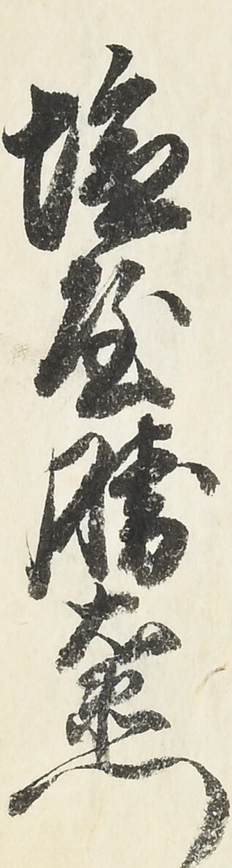塩屋勝右衛門㊞

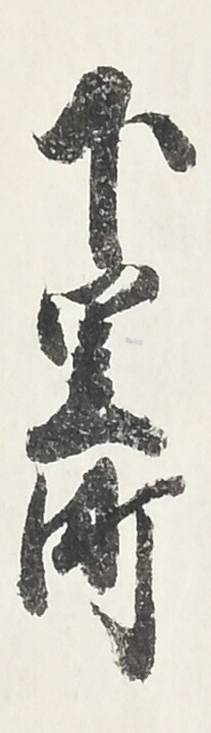下里町
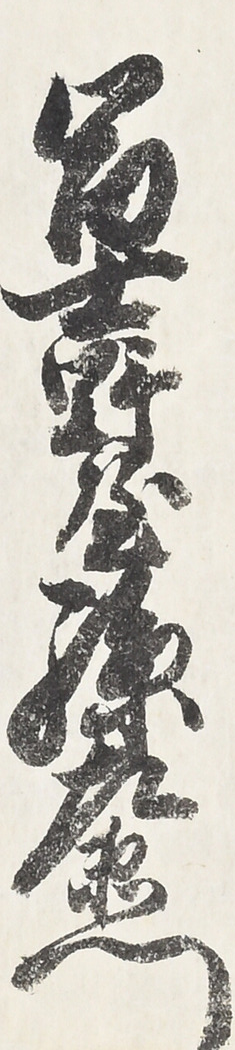冨士野屋孫左衛門㊞
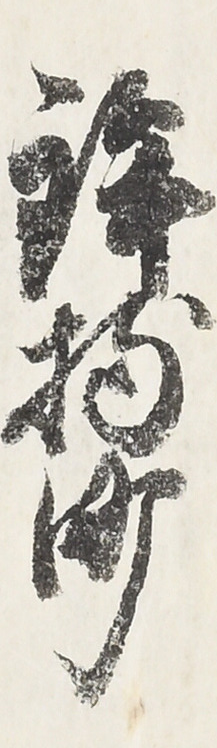鉾持町
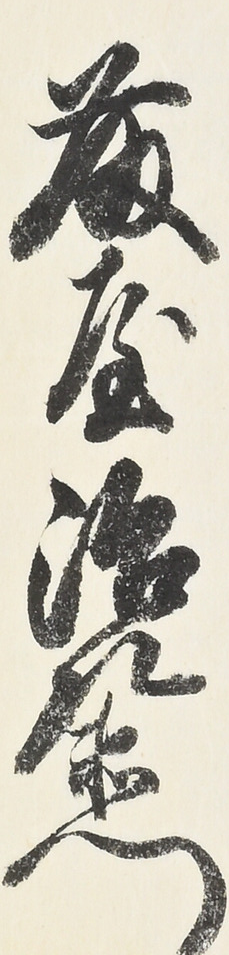藤屋治左衛門㊞
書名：永代太々御神楽名前帳
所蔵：伊那市立高遠町図書館・合同会社AMANE
